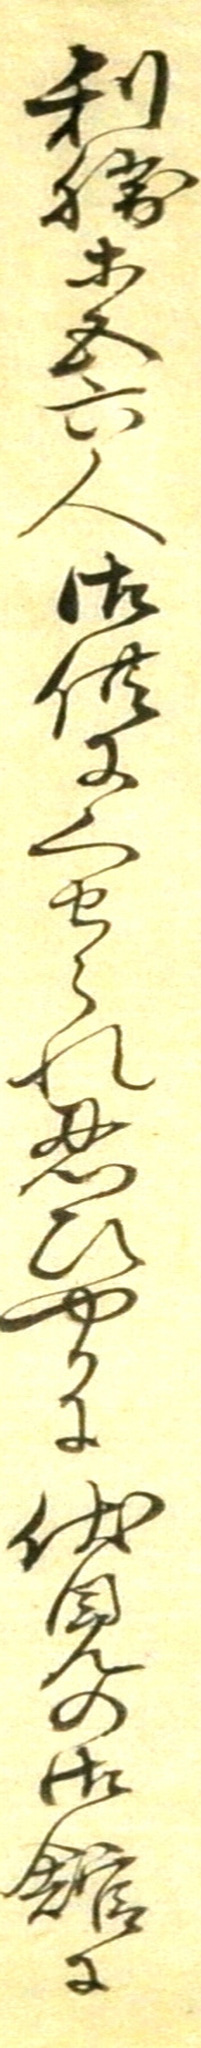利勝等五六人御供にくせられ忍ひやかに伏見の御館に
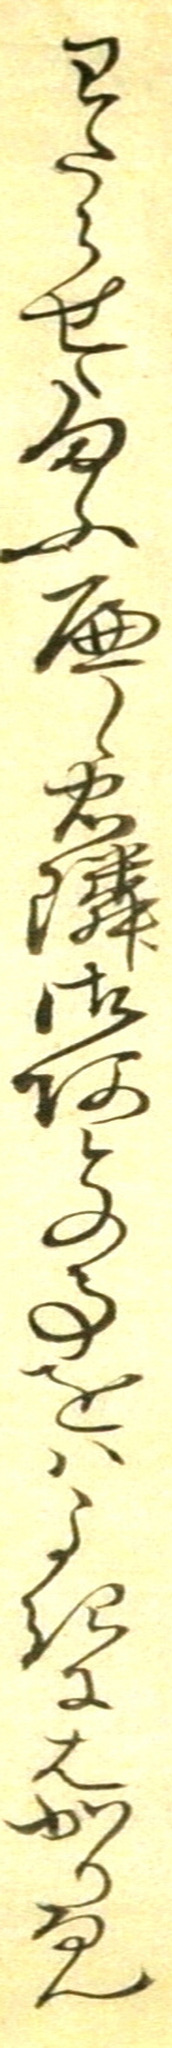わたらせたまふへし忠隣御あとの事をはよきにはかりなん
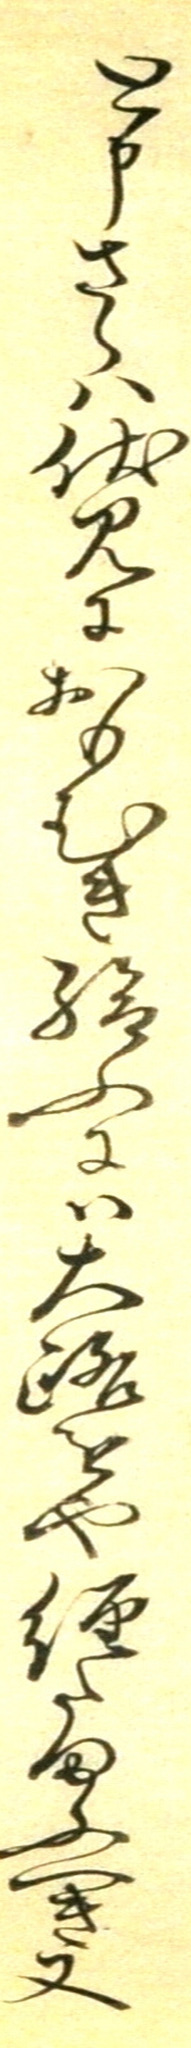と申さらは伏見におもむき給ふには大路をや経たまふへき又
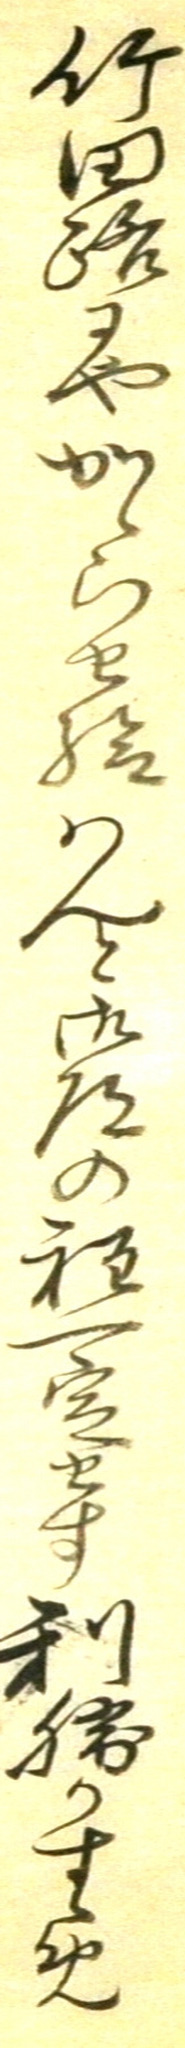竹田路にやかゝらせ給はんと御道の程一定せす利勝かすゝめ
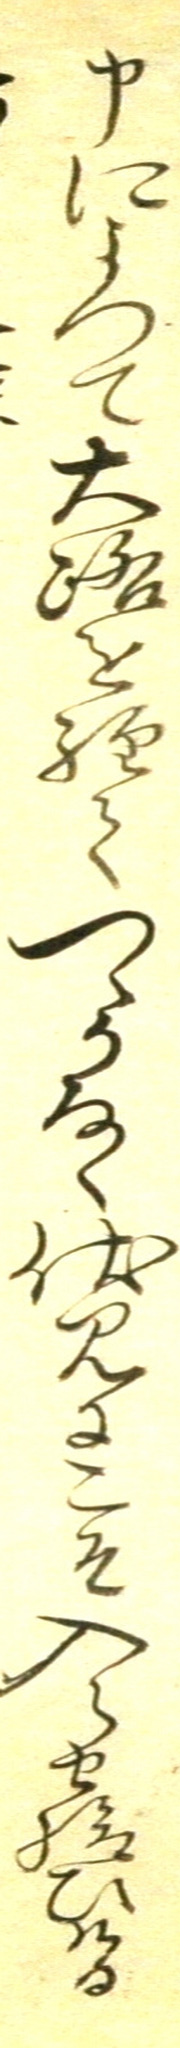申によつて大路を経てつゝかなく伏見にこそ入らせ給ひける
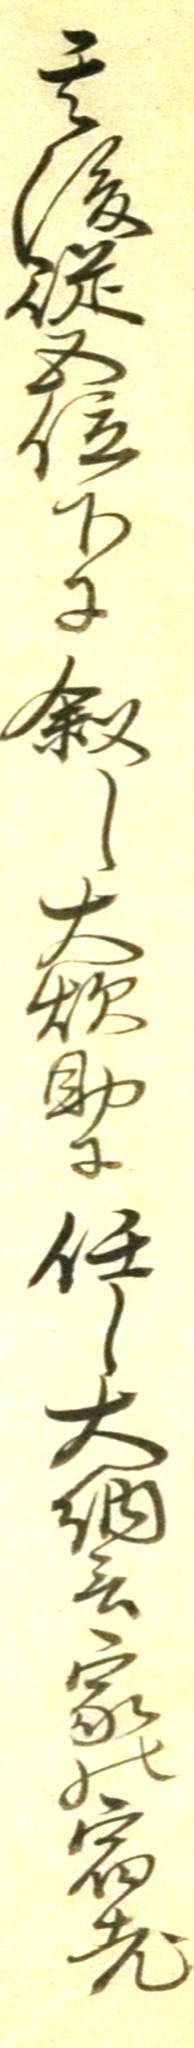其後従五位下に叙し大炊助に任し大納言家の宿老
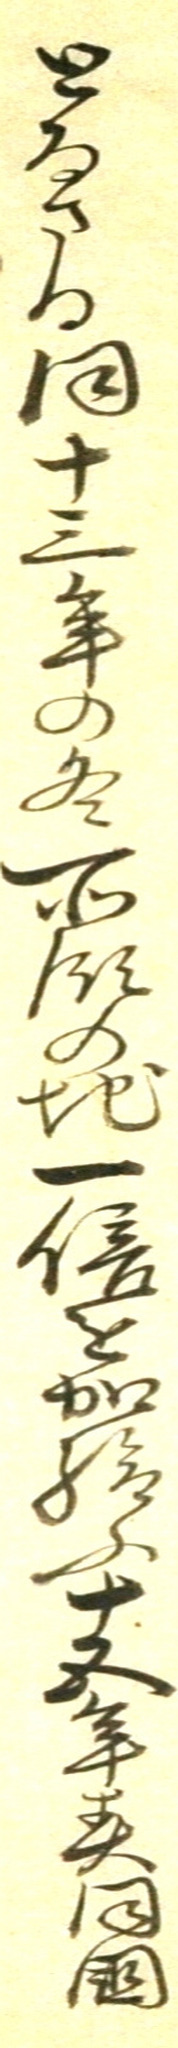となさる同十三年の冬所領の地一倍を加給ふ十五年春同国
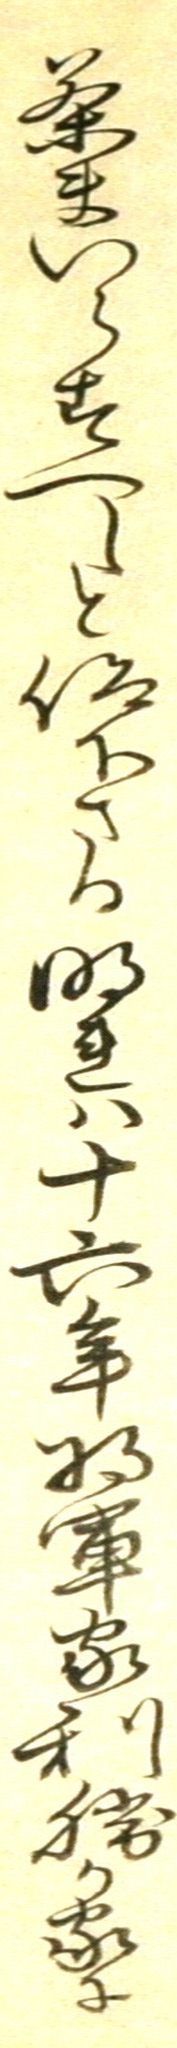茶まいらすへしと仰下さる明れは十六年将軍家利勝か家に
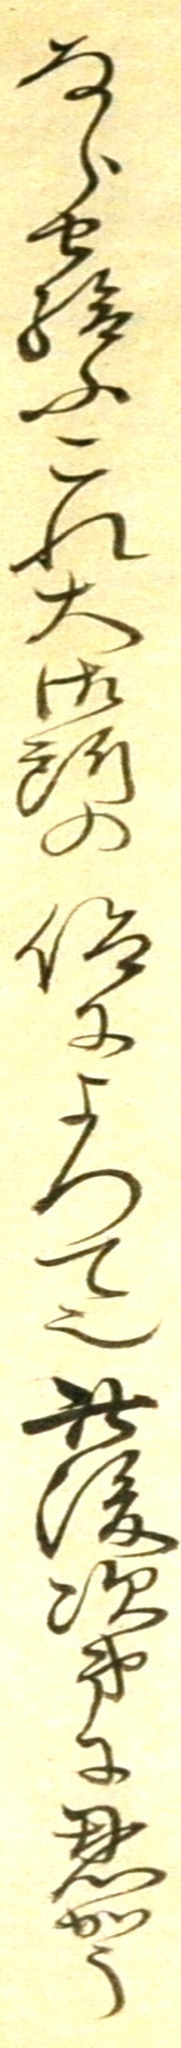ならせ給ふこれ大御所の仰によつて也此後次第に恩かう
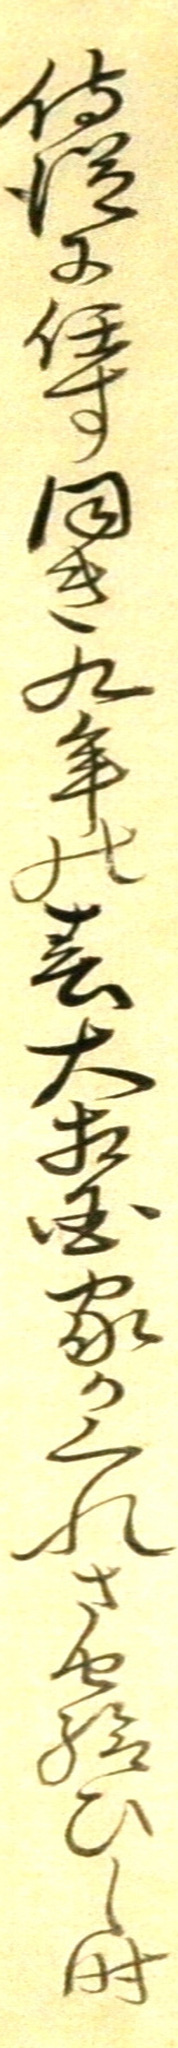侍従に任す同き九年の春大相国家かくれさせ給ひし時
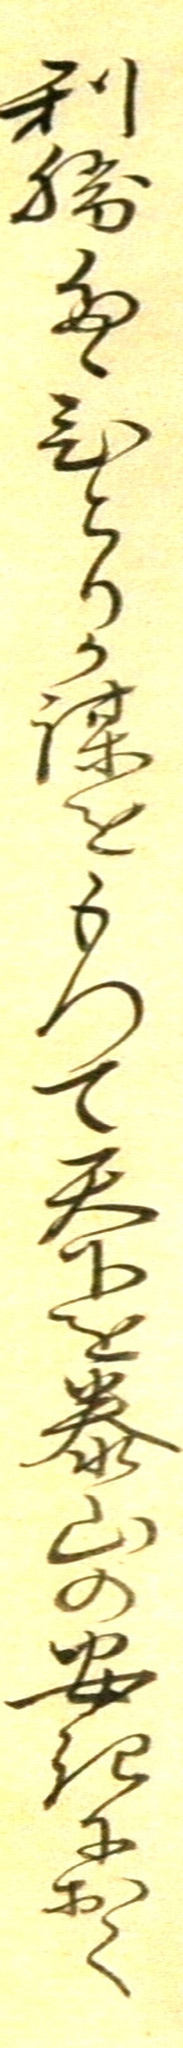利勝たゝひとりか謀をもつて天下を泰山の安きにおく

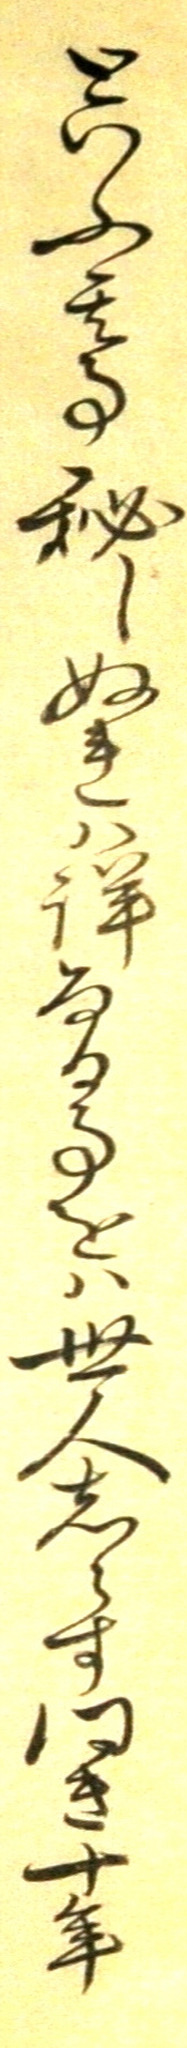といふ其事秘しぬれは詳なる事をは世人しらす同き十年
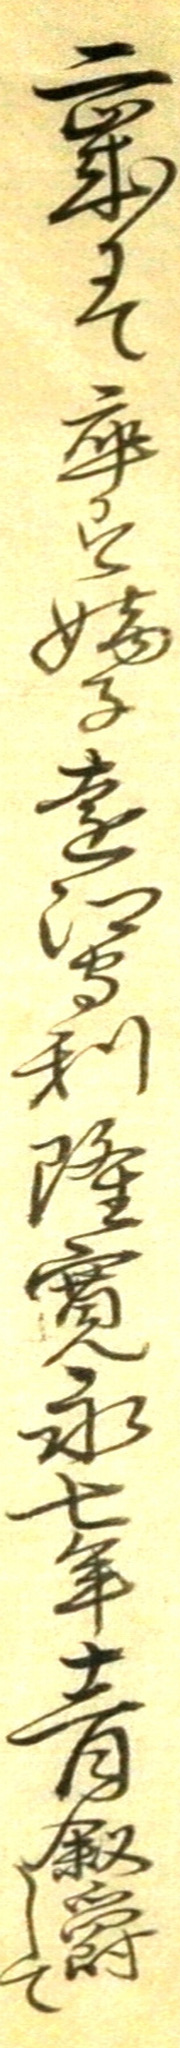二歳にて卒す嫡子遠江守利隆寛永七年十二月叙爵して
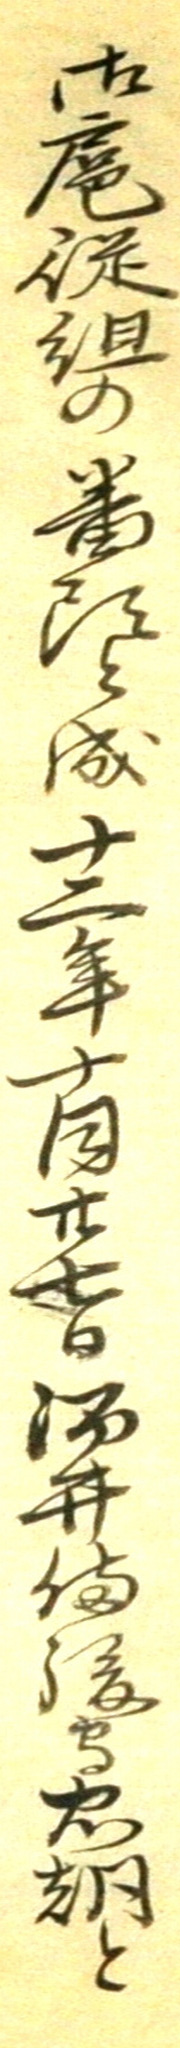御扈従組の番頭と成十二年十月廿七日酒井備後守忠朝と
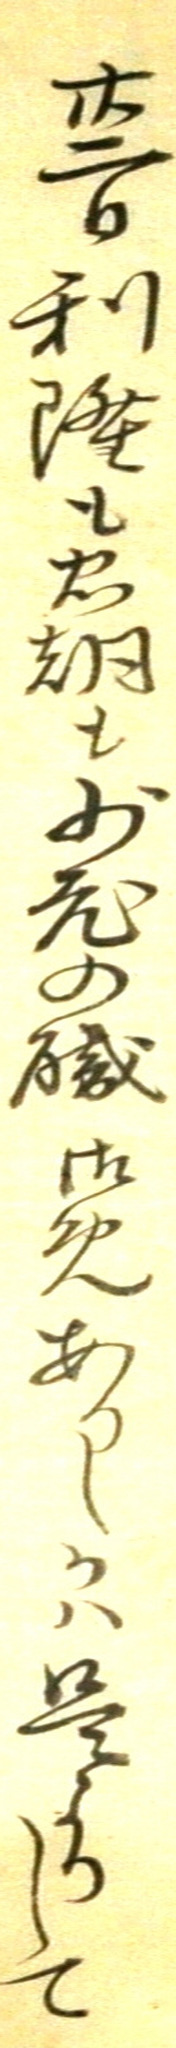廿二日利隆も忠朝も少老の職御免ありしかは是よりして
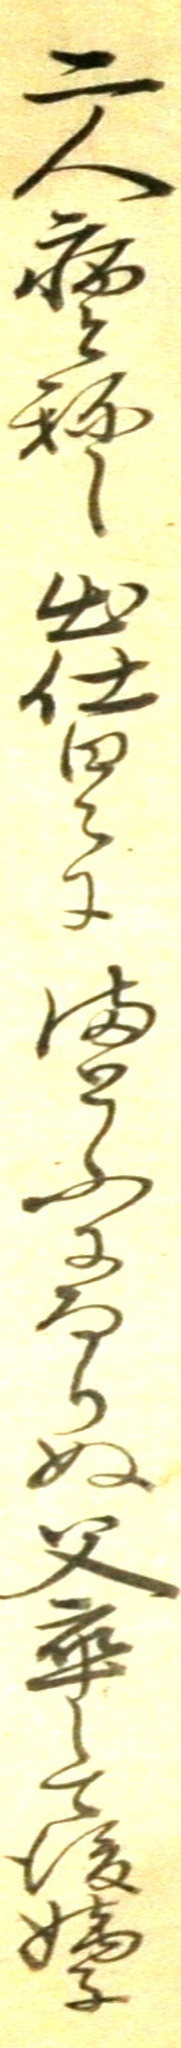二人病と称し出仕日々にまとふになりぬ父卒して後嫡子
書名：藩翰譜（五）
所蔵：伊那市立高遠町図書館・合同会社AMANE
